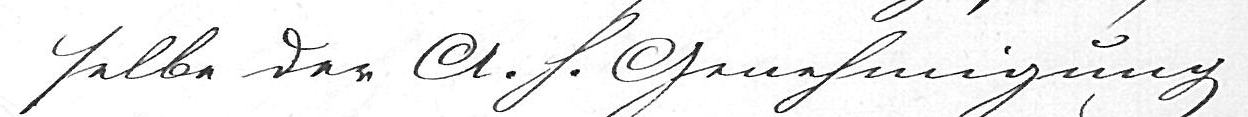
selbe der A.h. Genehmigung
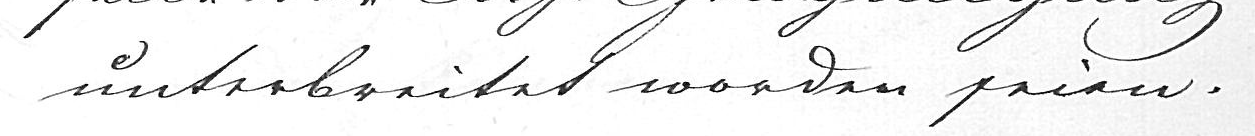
unterbreitet worden seien.
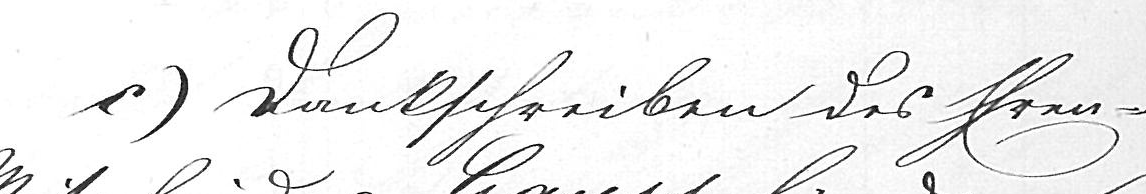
c) Dankschreiben des Ehren-
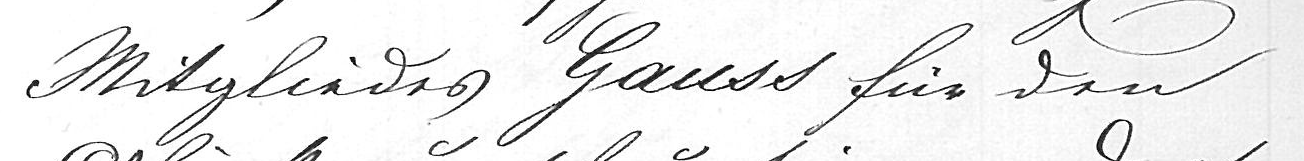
Mitgliedes Gauss für den
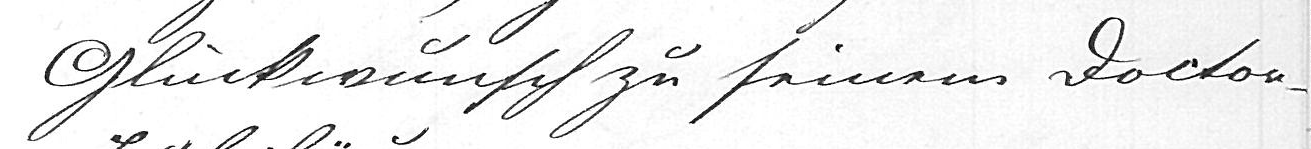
Glückwunsch zu seinem Doctor-
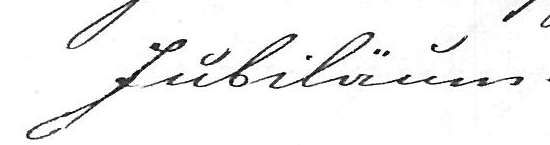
Jubiläum.
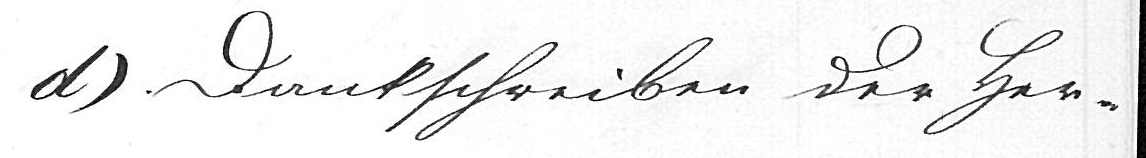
d) Dankschreiben der Her-
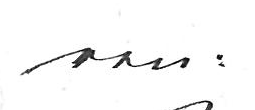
ren:
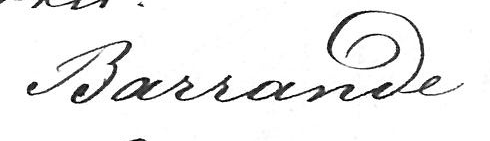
Barrande
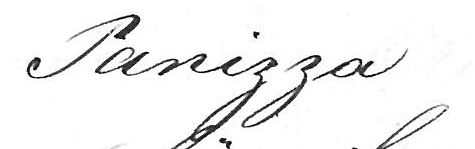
Panizza
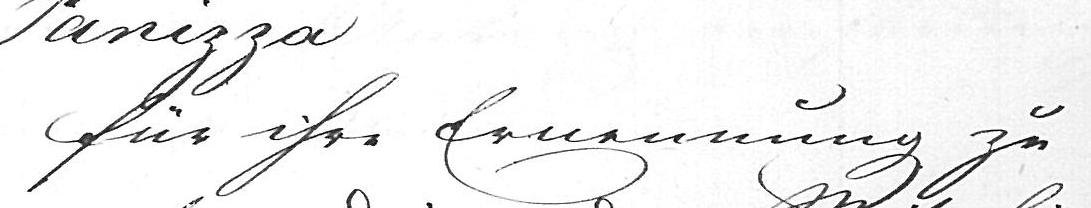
für ihre Ernennung zu
